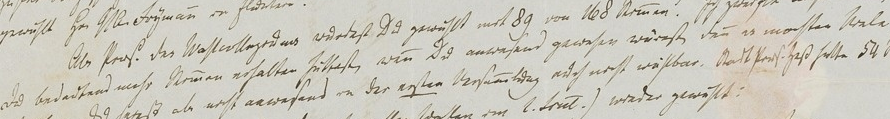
Du bedeutend mehr Stimmen erhalten hättest, wenn Du anwesend gewesen wärest, denn es mochten Viele
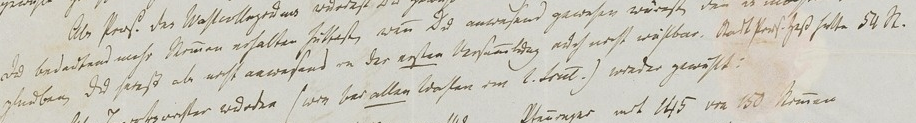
glauben, Du seiest als nicht anwesend in der ersten Versammlung auch nicht wählbar. Stadt Präs. Heß hatte 54 St.
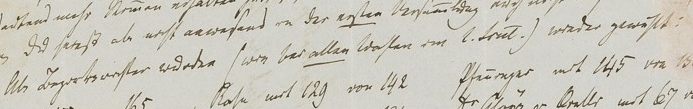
Als Bezirksrichter wurden (wie bei allen Wahlen im 1. Srut) wieder gewählt:
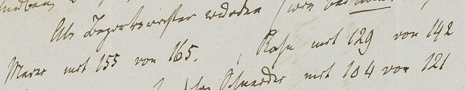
Rahn mit 129 von 142 Pfenninger mit 145 von 150
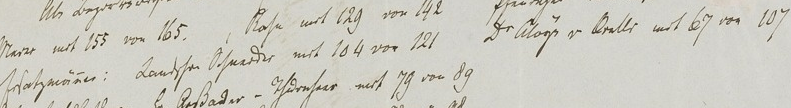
Ersatzmänner: Landschr. Schneider mit 104 von 121 DrAloys v. Orelli mit 67 von 107
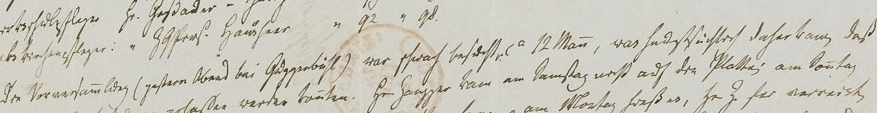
Die Vorversammlung ( gestern Abend bei Guggenbühl) war schwach besucht v. ca 12 Mann, was hauptsächlich daher kam, daß
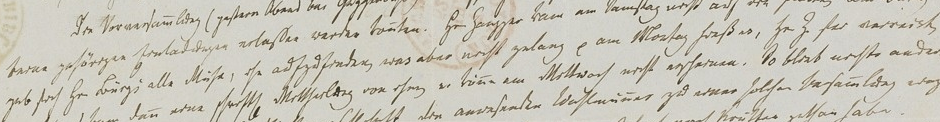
gab sich Hr. Bürgi alle Mühe, ihn aufzufinden, was aber nicht gelang & am Montag hieß es, Hr. Z. sei verreist,
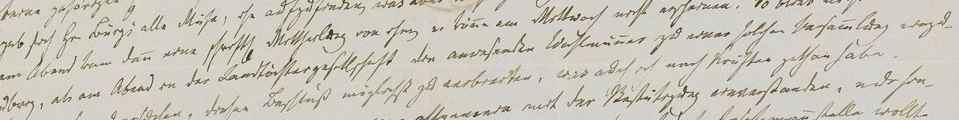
übrig, als am Abend in der Landtöchtergesellschaft die anwesenden Wahlmänner zu einer solchen Versammlung einzu-
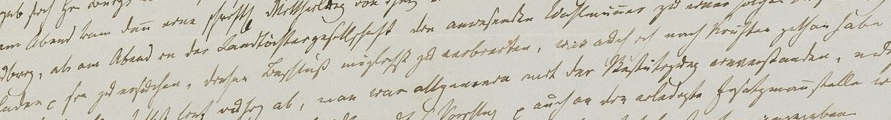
laden & sie zu ersuchen, diesen Beschluß möglichst zu verbreiten, was auch ich nach Kräften gethan habe.
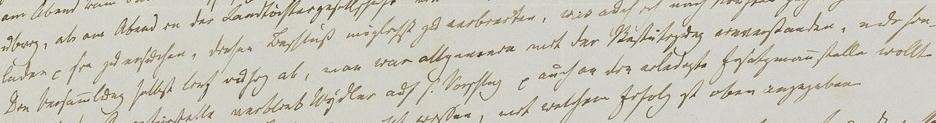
Die Versammlung selbst lief ruhig ab, man war allgemein mit der Bestätigung einverstanden, nur hin-
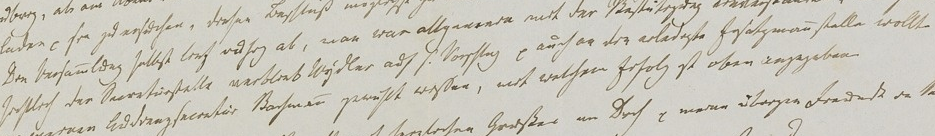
sichtlich der Secretärstelle verblieb Wydler auf s. Vorschlag & auch an die erledigte Ersatzmannstelle wollte
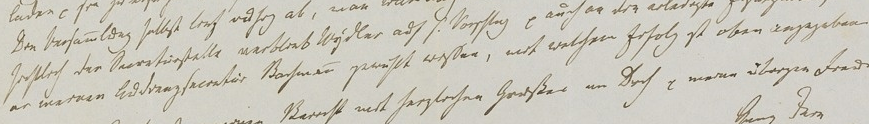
er meinen Audienzsecretär Bachmann gewählt wissen, mit welchem Erfolg ist oben angegeben.
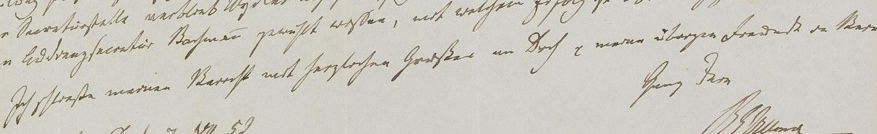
Ich schließe meinen Bericht mit herzlichen Grüßen an Dich & meine übrigen Freunde in Bern
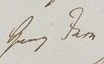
Ganz Dein
